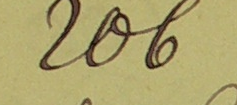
206
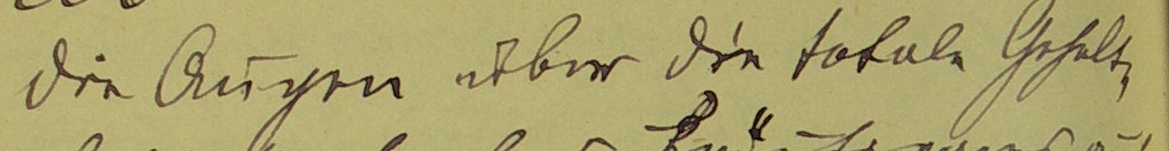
die Augen über die totale Gefühl¬
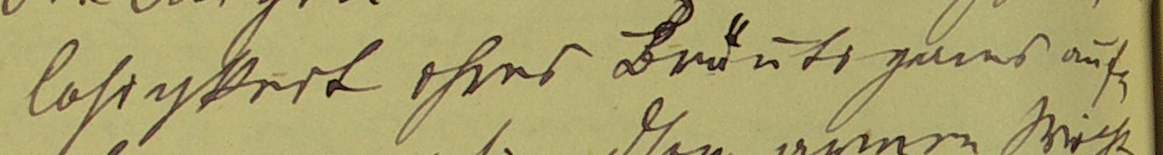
losigkeit ihres Bräutigams auf¬
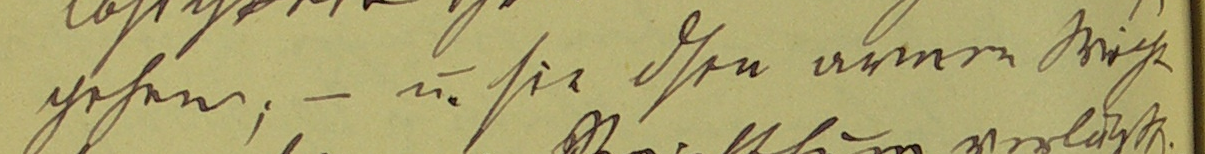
gehen;-- und sie diesen armen Wicht
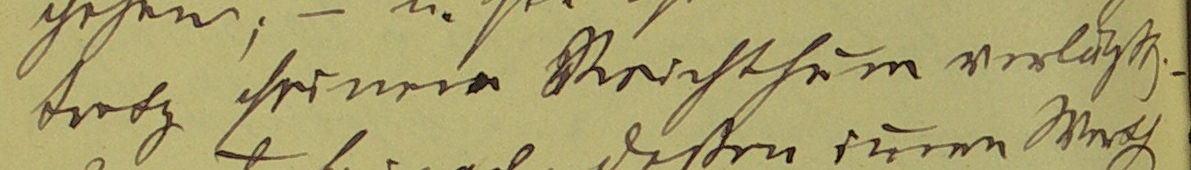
trotz seinem Reichtum verläßt
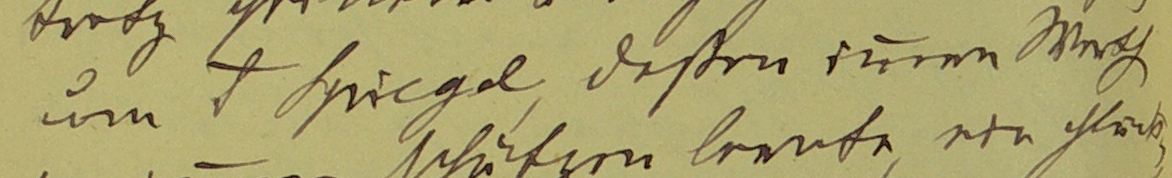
um mit Spiegel deßen inneren Werth
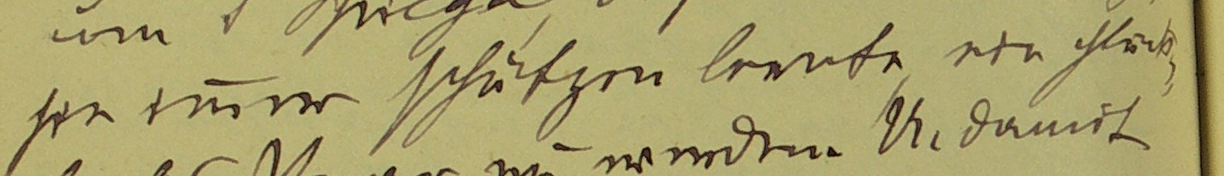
sie immer schätzen lernte, ein glück¬
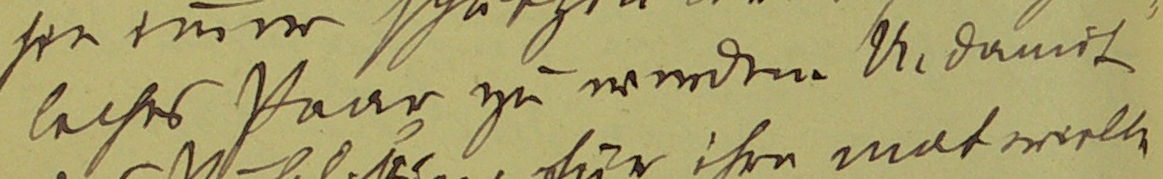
liches Paar zu werden. Und damit
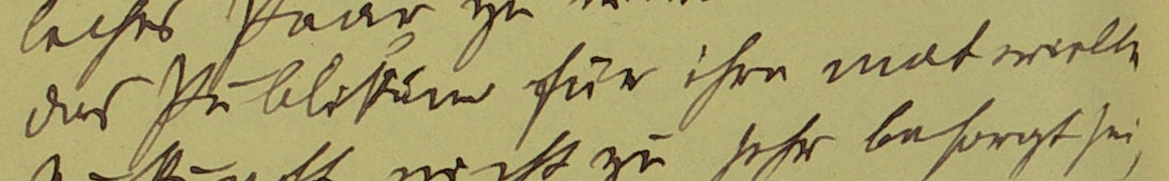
das Publikum für ihre materielle
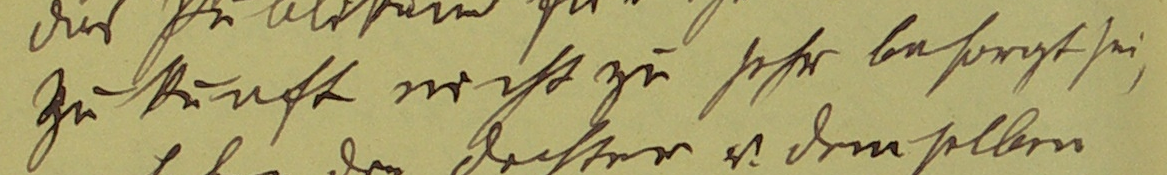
Zukunft nicht zu sehr besorgt sei
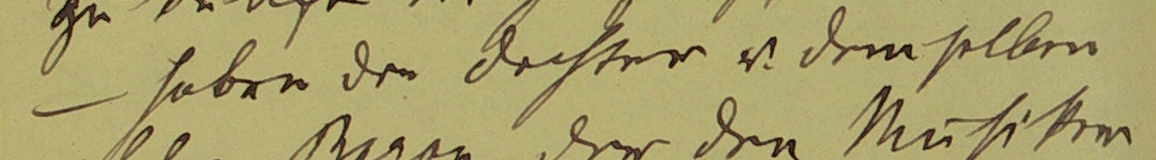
– haben die Dichter von demselben
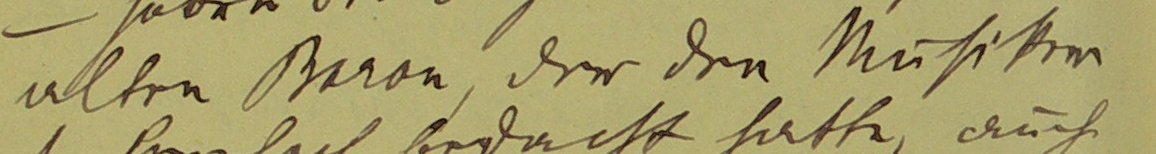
alten Baron, der den Musiker
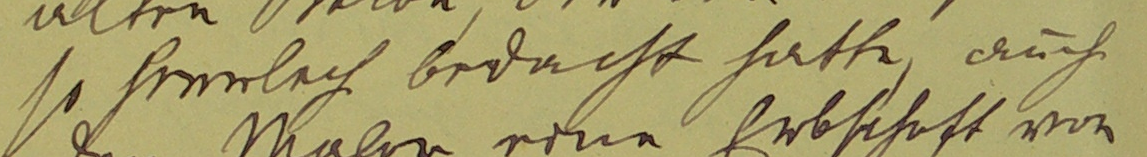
so herrlich bedacht hatte, auch
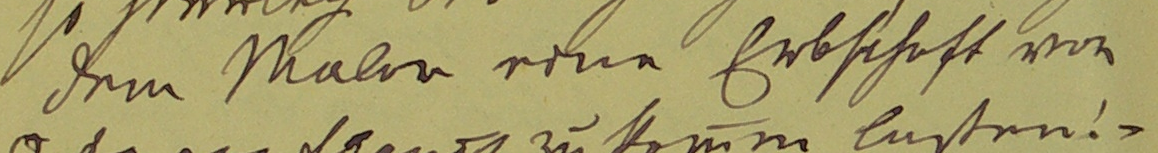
dem Maler eine Erbschaft von
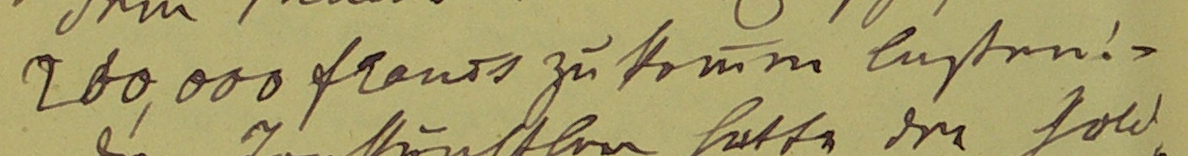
200,000 Fl. zukommen laßen ! –
